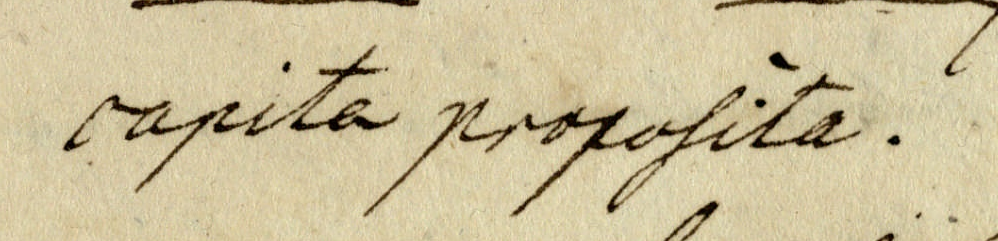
capita proposita.
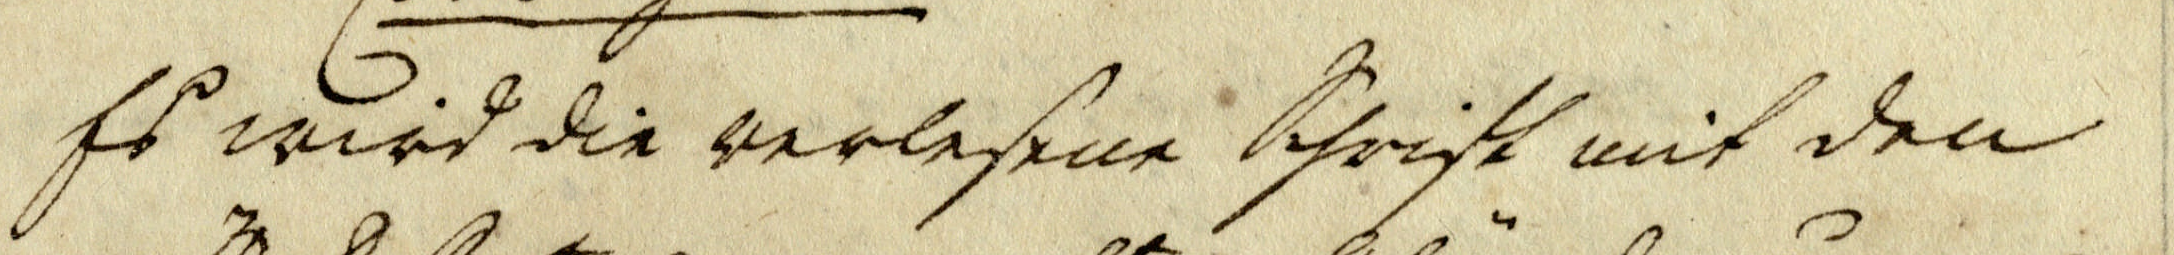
Es wird die verlesene Schrift mit den
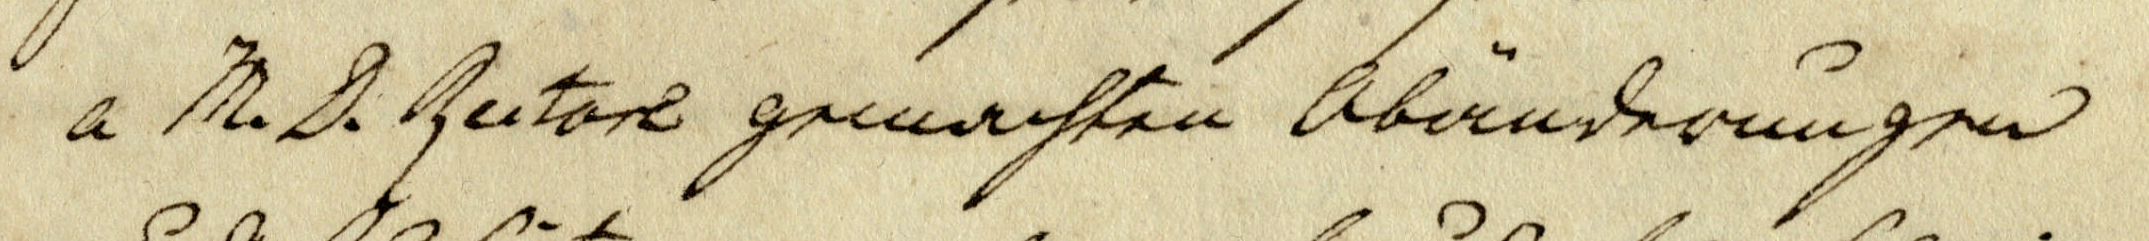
a M. D. Rectore gemachten Abänderungen
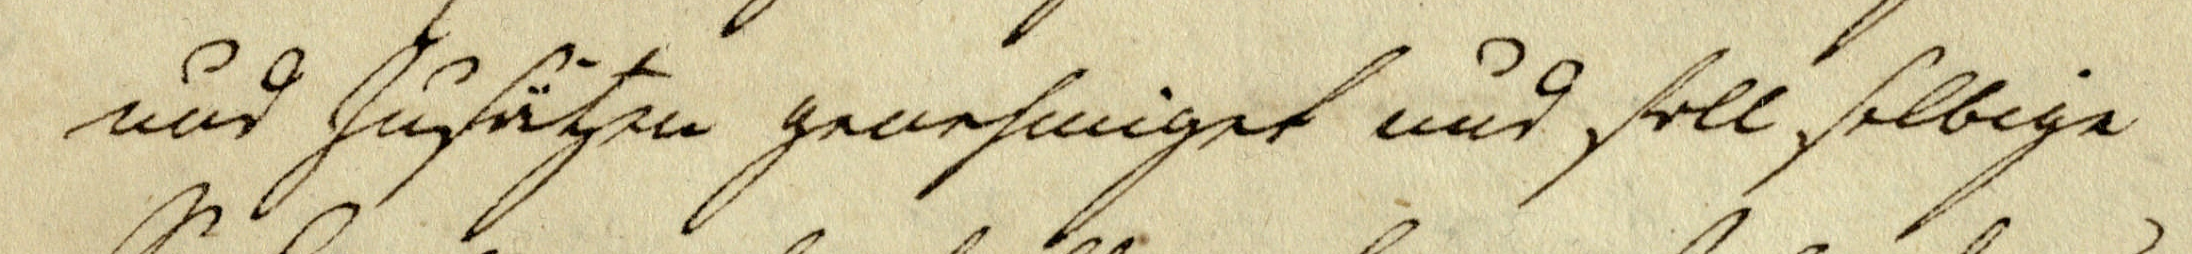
und Zusätzen genehmiget und soll selbige
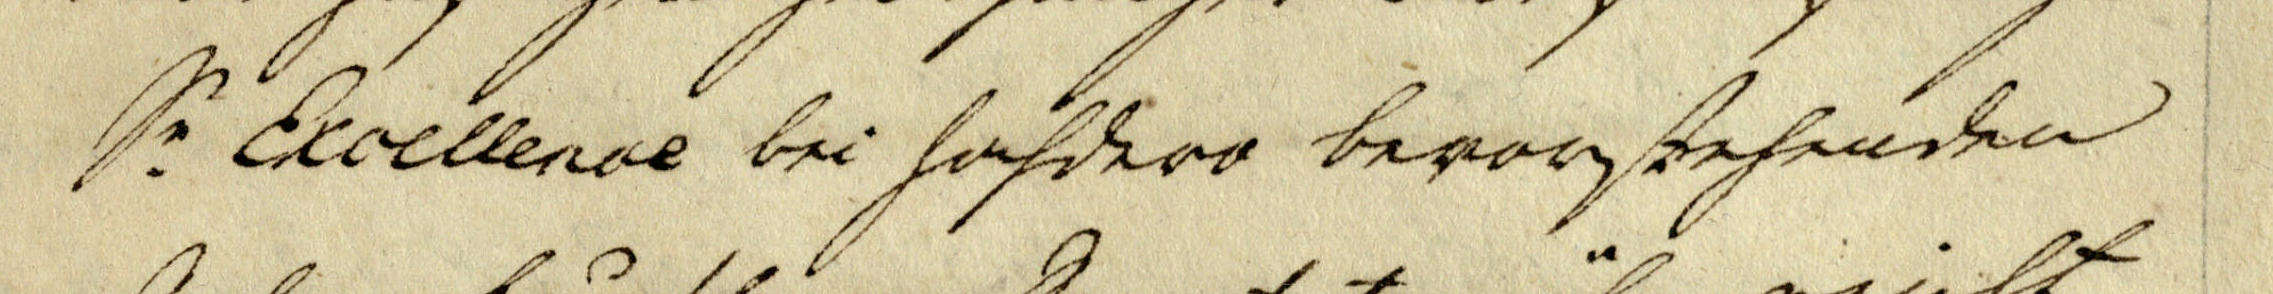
Sr Excellence bei hochdero bevorstehenden
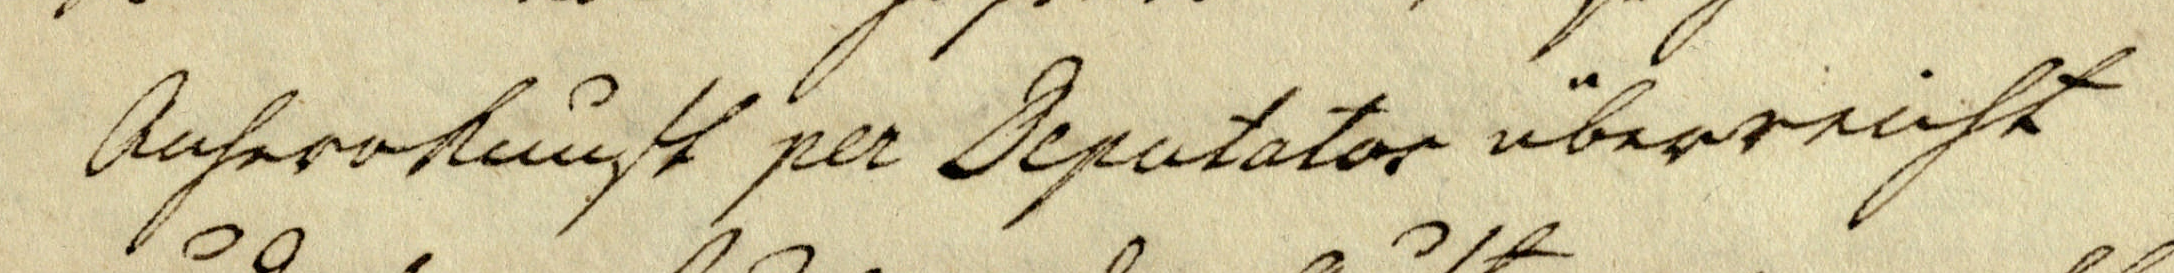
Anherokunft per Deputatos überreicht
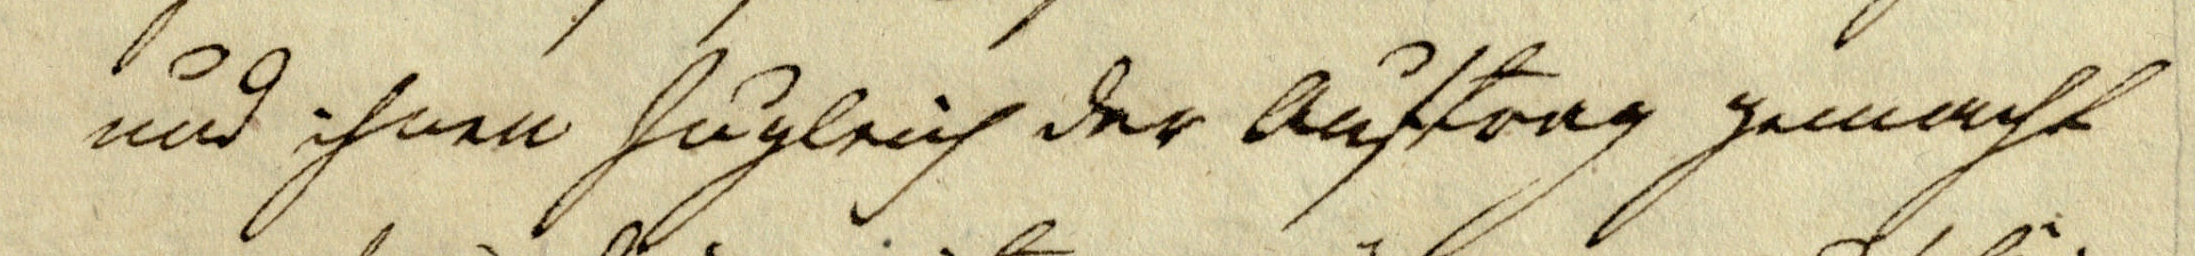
und ihnen zugleich der Auftrag gemacht
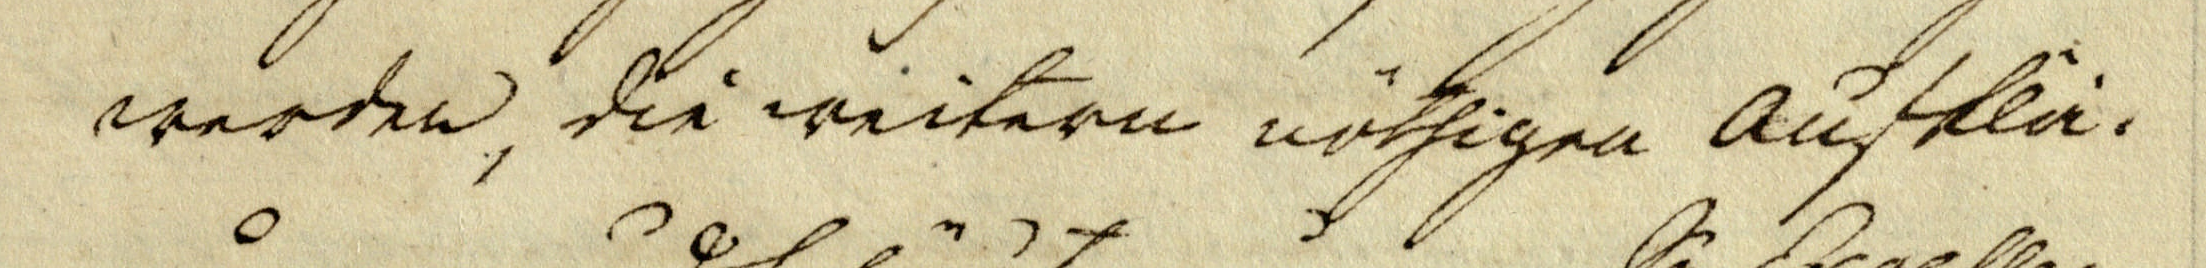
werden, die weitern nöthigen Aufklä¬
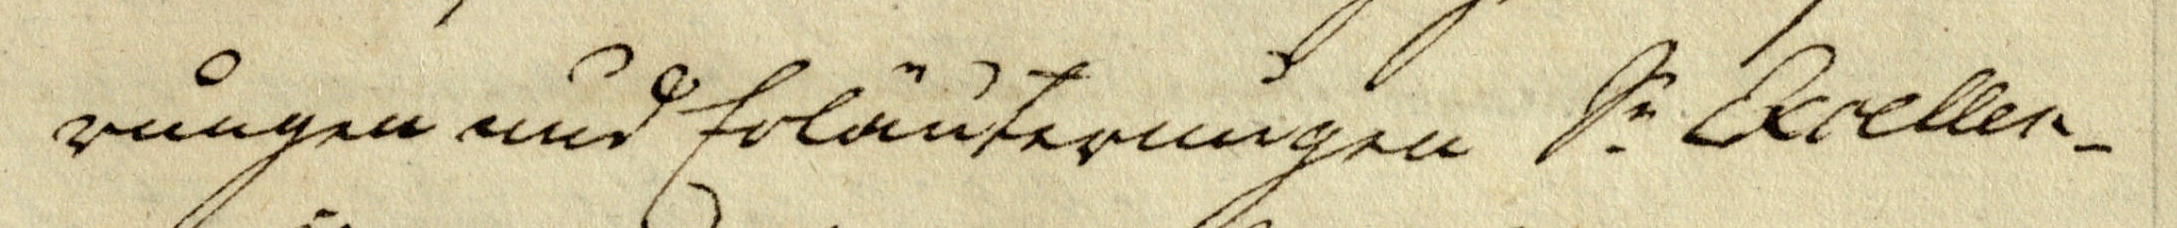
rungen und Erläuterungen Sr Excellen¬
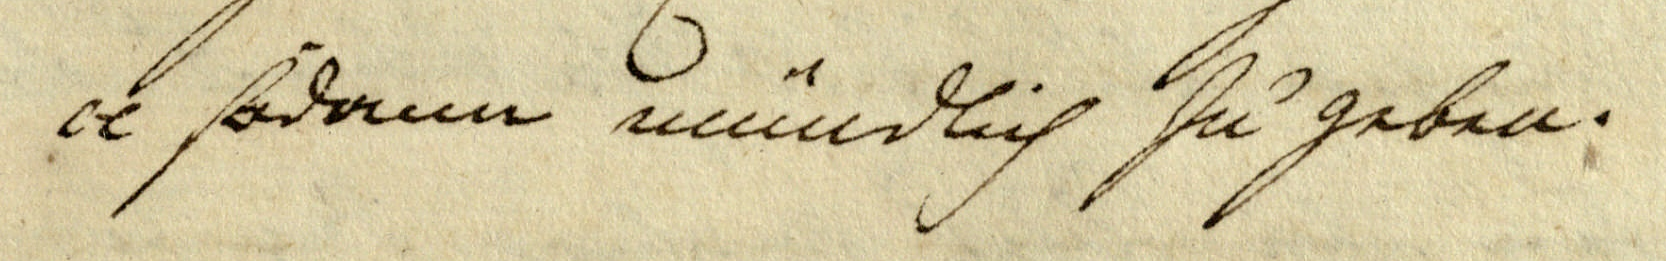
ce sodann mündlich zu geben.
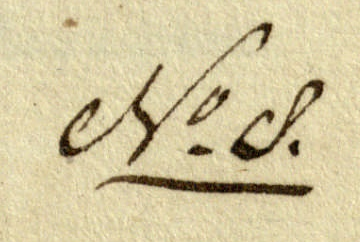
No 8.
